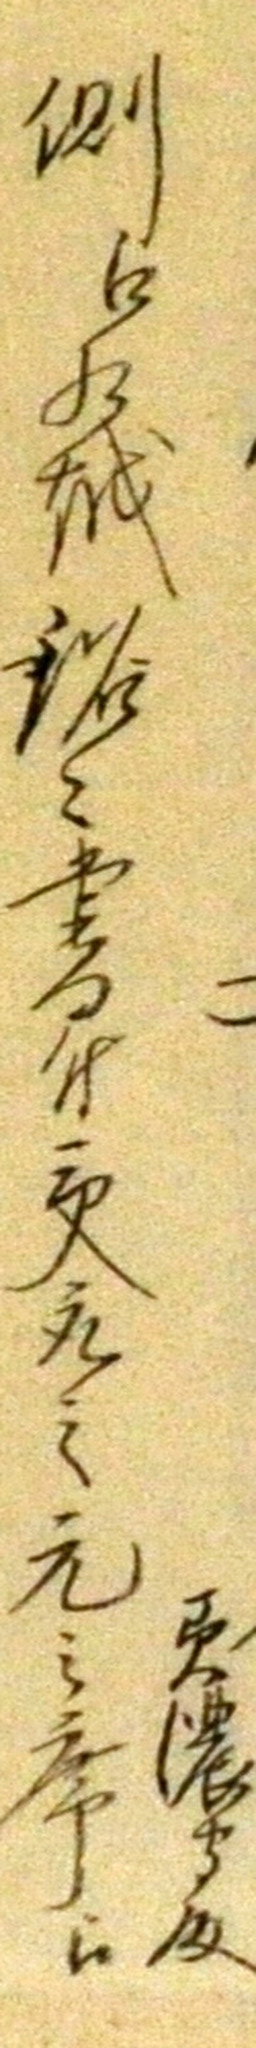側え相越銘々書付受取之元之席え
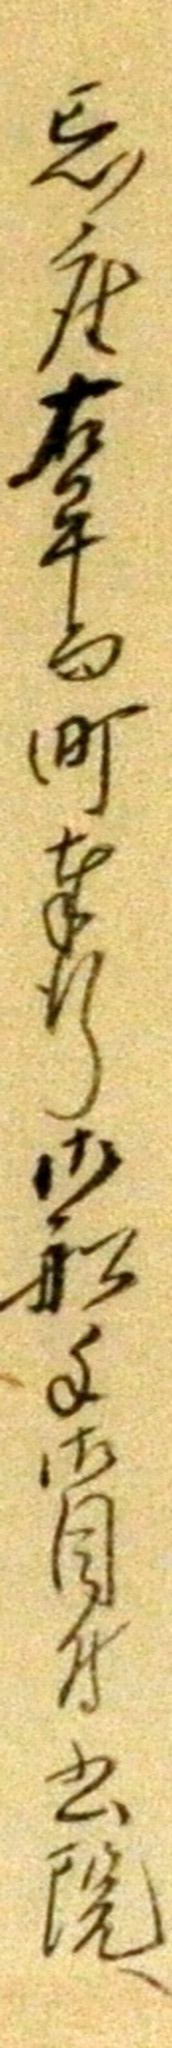着座右畢而町奉行御船手御目付書院へ
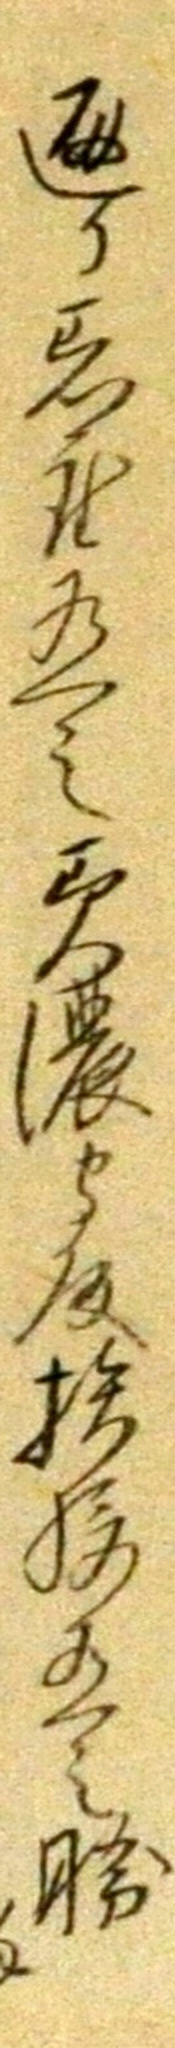通り着座有之美濃守殿挨拶有之勝手
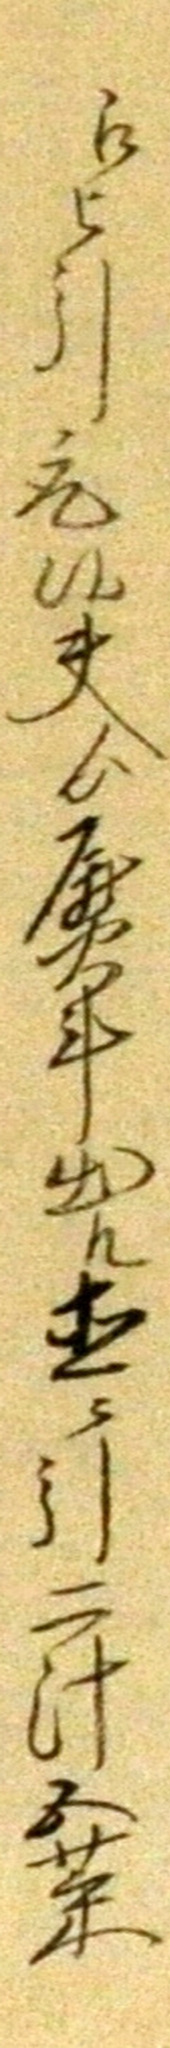え被引取候夫ゟ熨斗出ル直二引二汁五菜
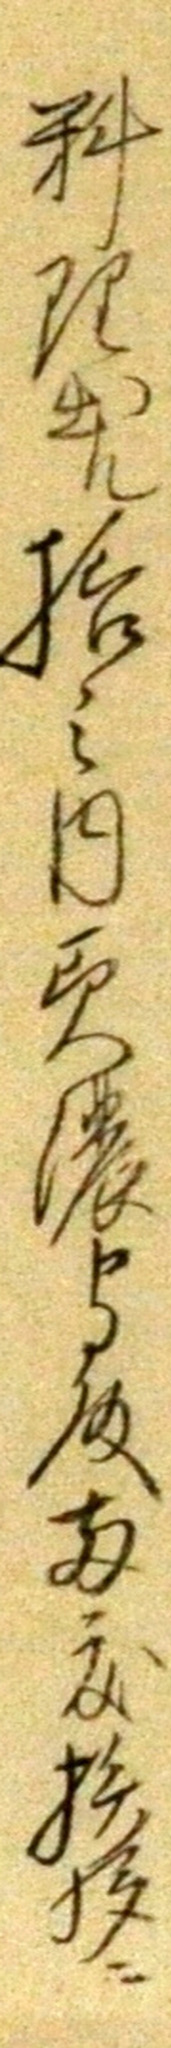料理出ル膳之内美濃守殿両度挨拶ニ
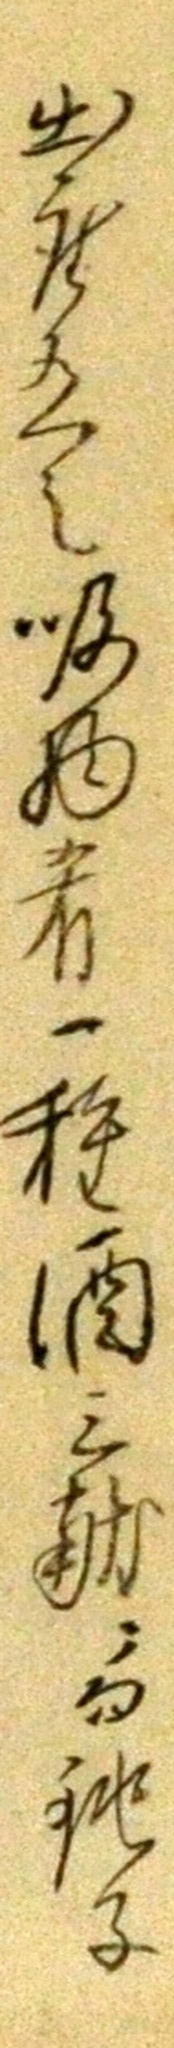出座有之吸物肴一種酒三献ニ而銚子
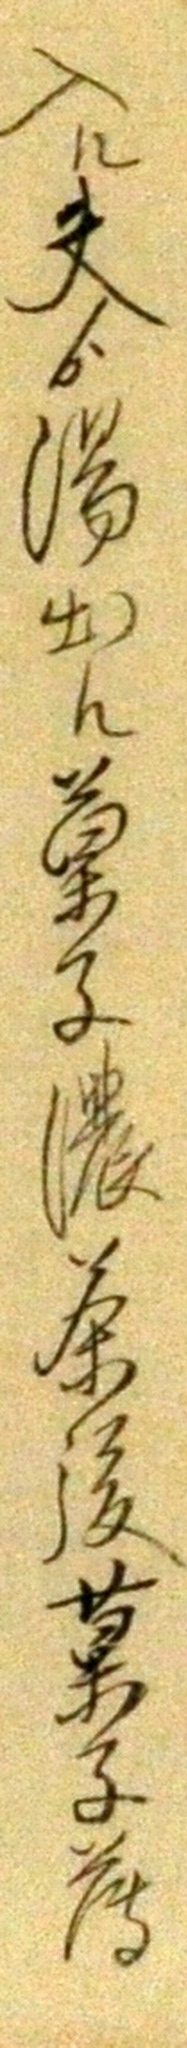入ル夫ゟ湯出ル菓子濃茶後菓子薄
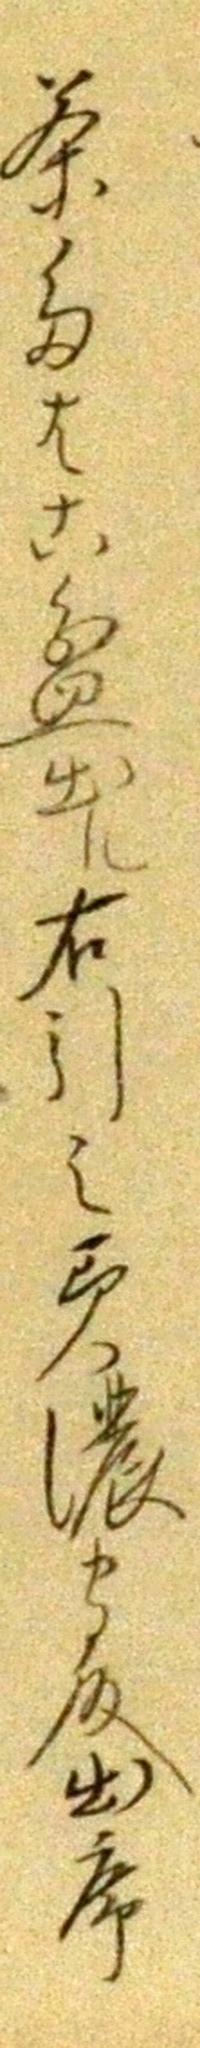茶多たはこ盆出ル右引之美濃守殿出席
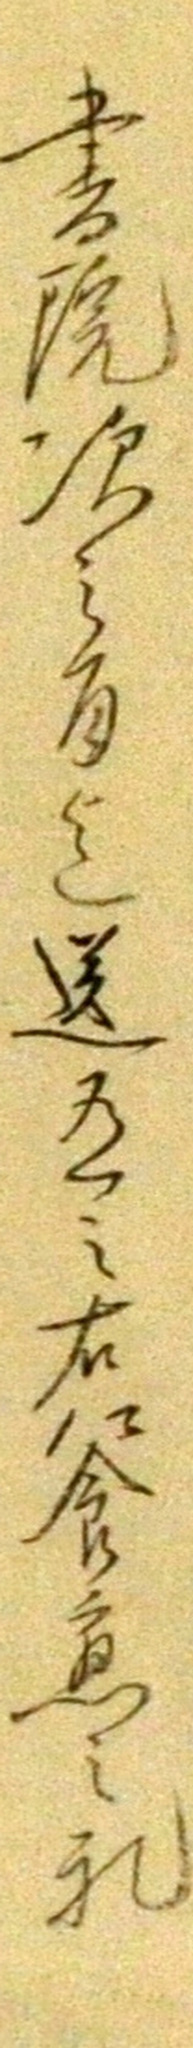書院次之間迄送有之右饗応之礼
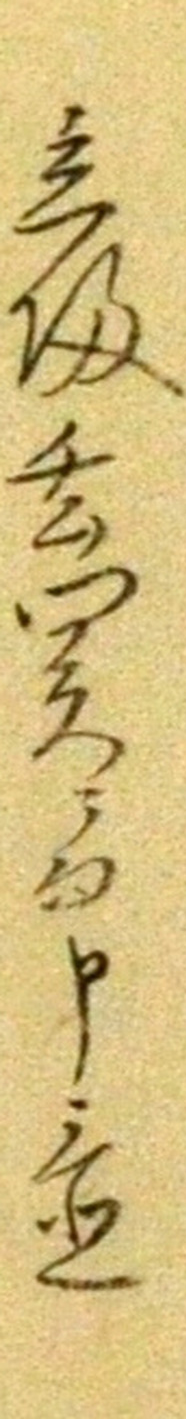立帰玄関ニ而申置

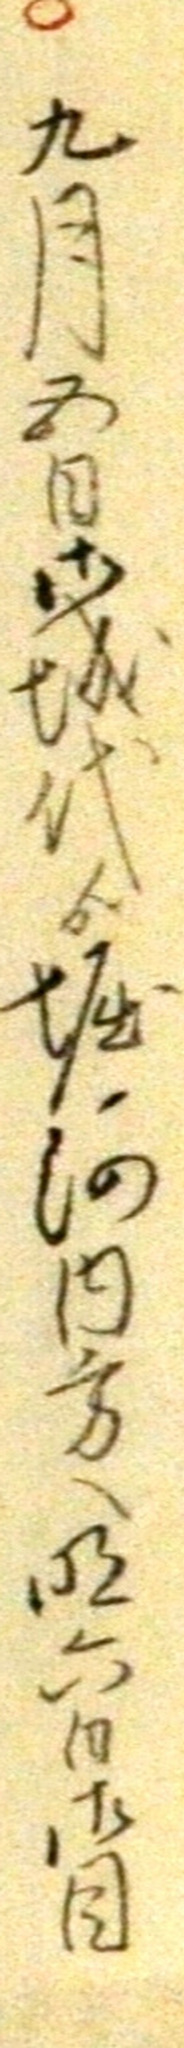九月五日御城代ゟ堀河内方へ明六日御目
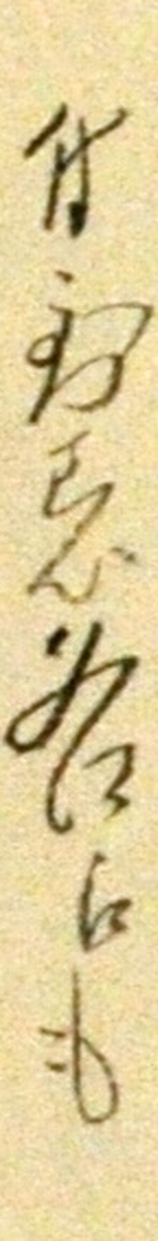付到着各えも
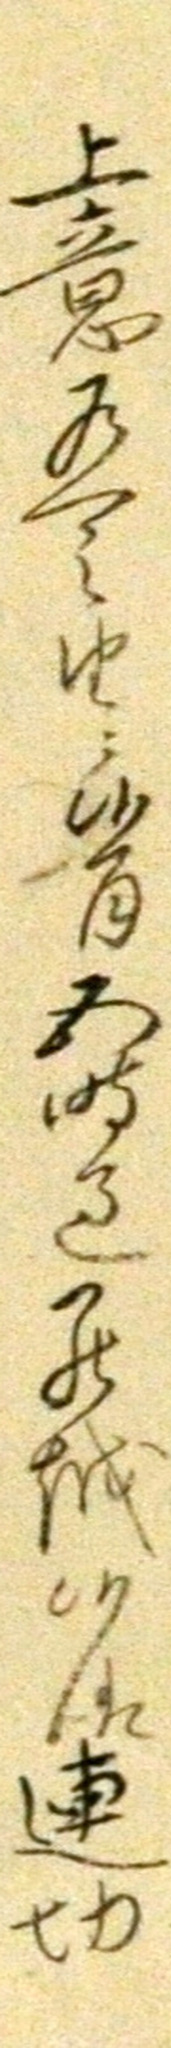上意有之由二候間五時過罷越候様連切
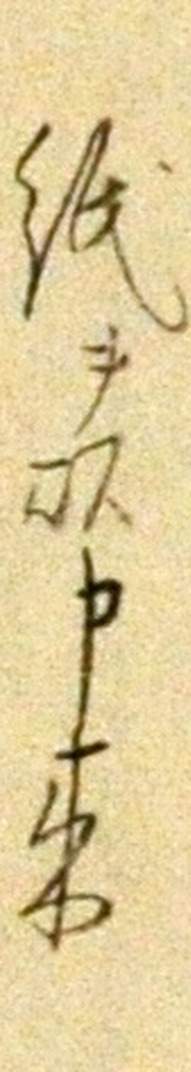紙ヲ以申来
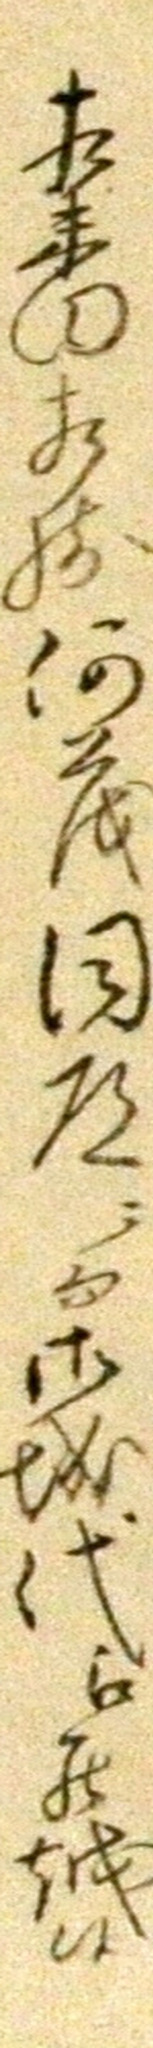相番相揃何も同道ニ而御城代え罷越候
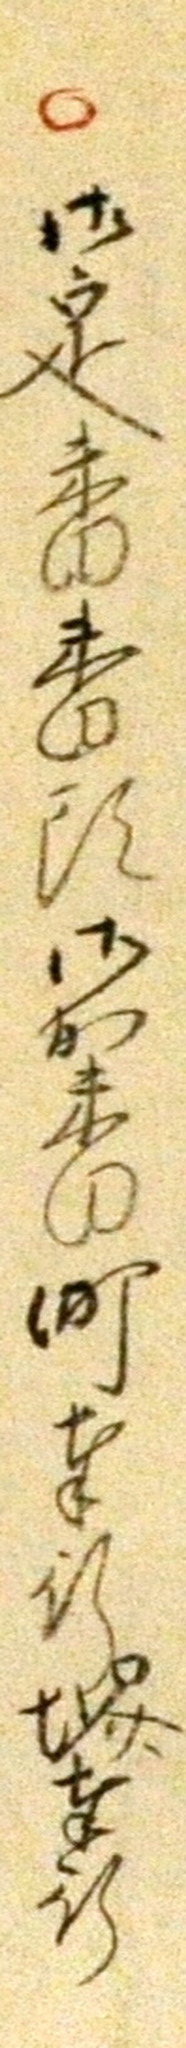御定番番頭御加番町奉行堺奉行
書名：大阪加番関係諸書留〔一括〕
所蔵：伊那市立高遠町図書館・合同会社AMANE
